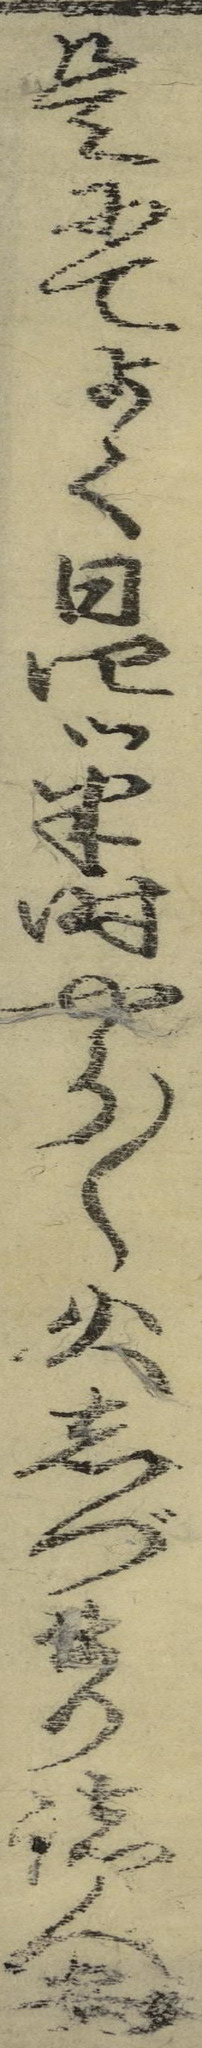是にてよく日四ツ半時やう〳〵火しづまり諸人安
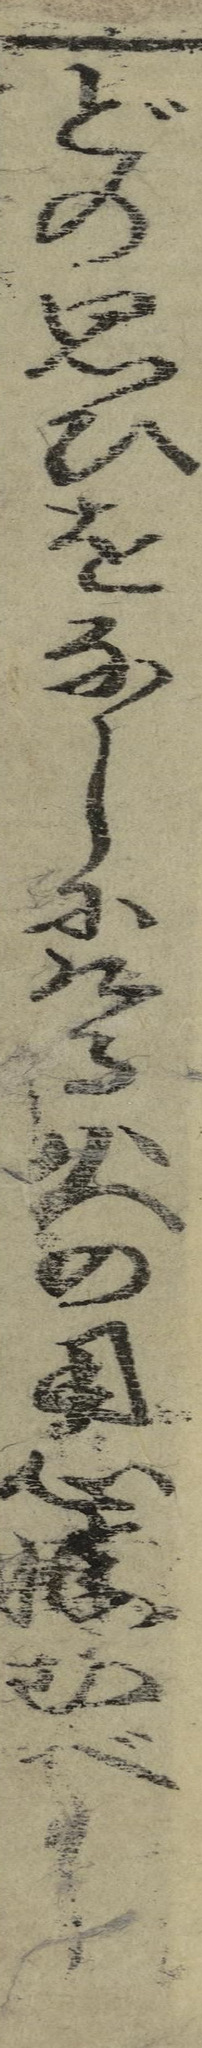どの思ひをなしにける火の用心慎むべし？也？
